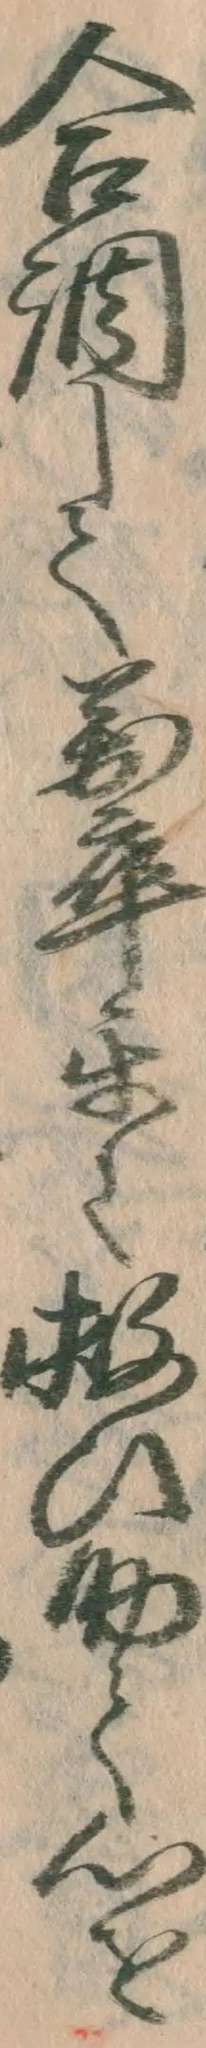合調して萬卒互に救ひ助て心を
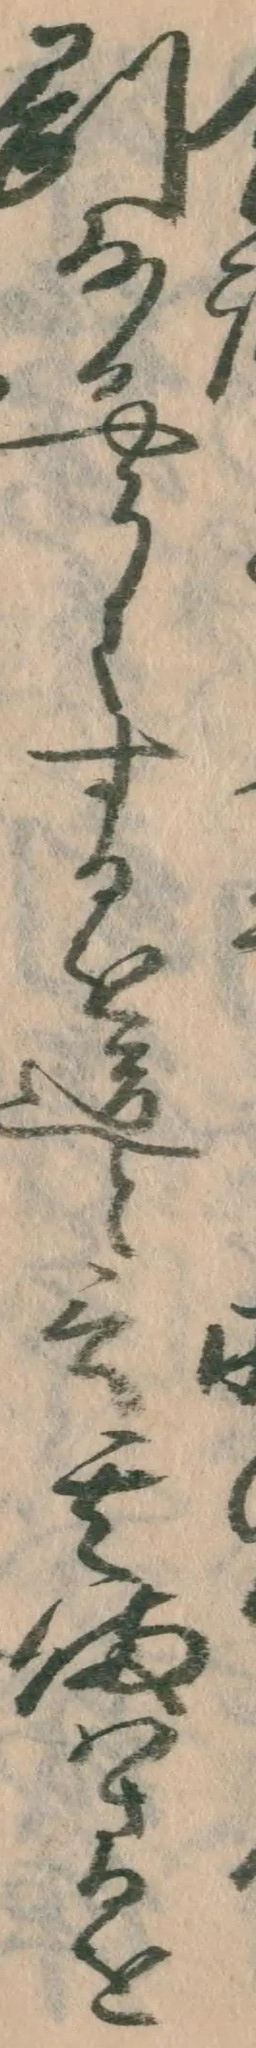剛なるやうにするを道と云其備ハさるを
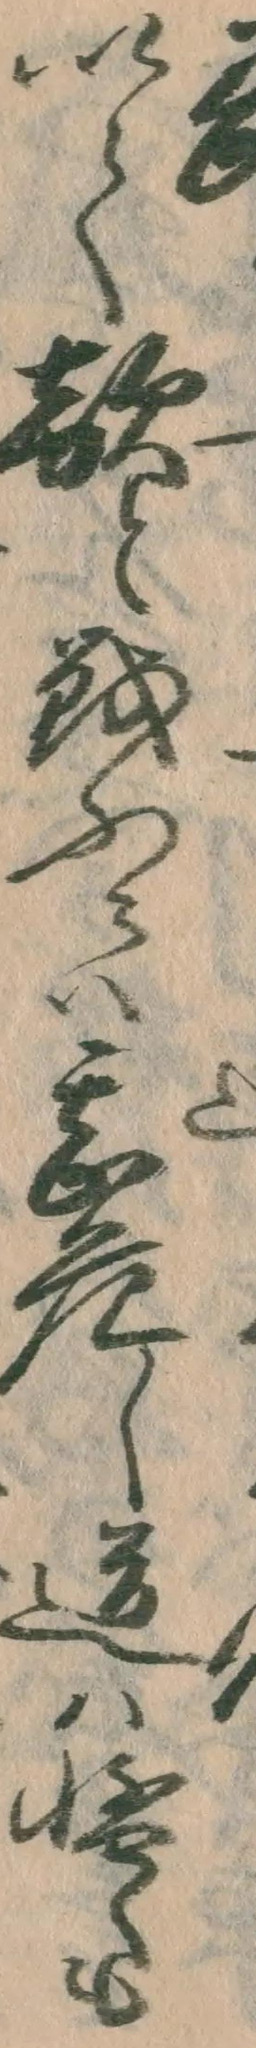以て敵と戦ふニハ甚危し道ハ暫くも
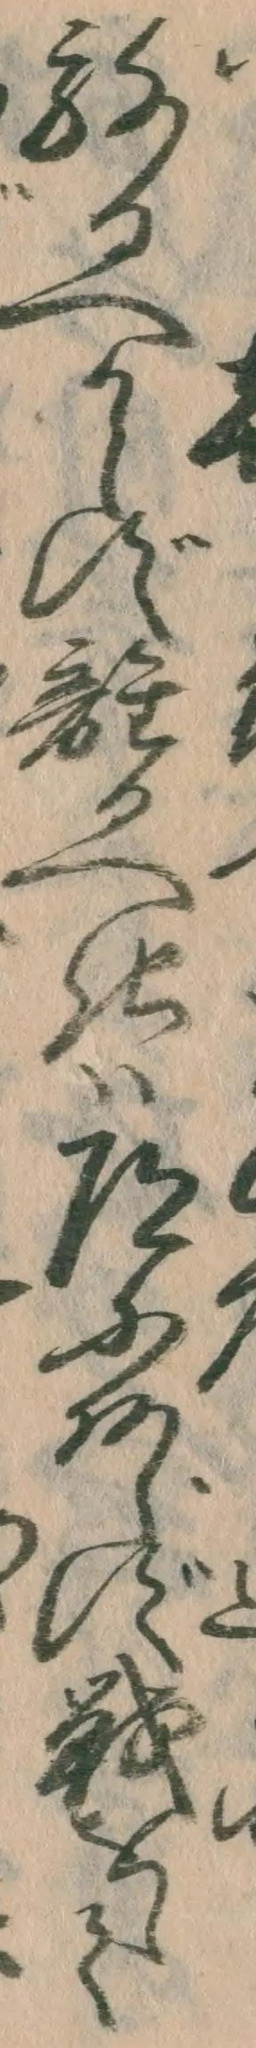放るへからず離るへきハ道にあらず戦をして
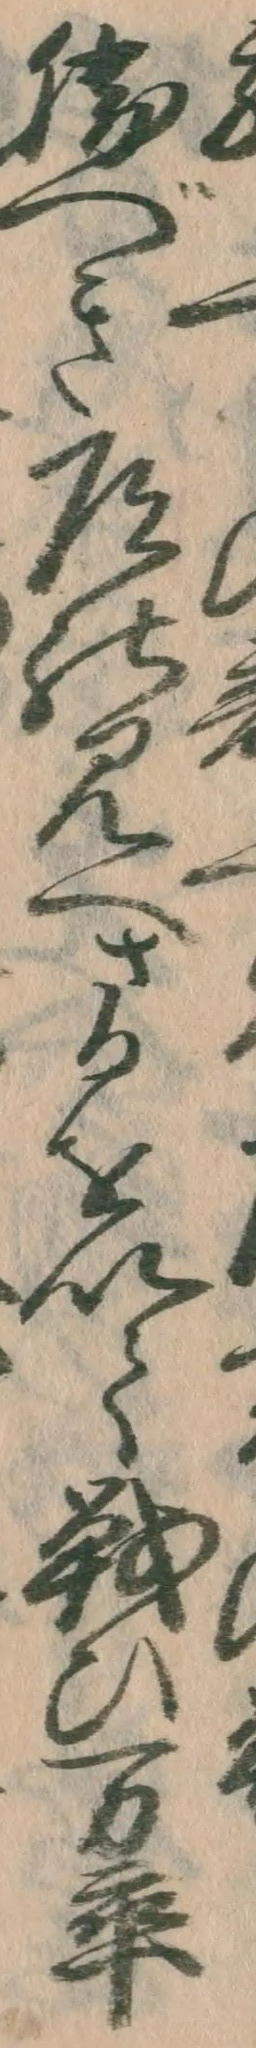勝べき道の見へさるを以て戦ひ万卒
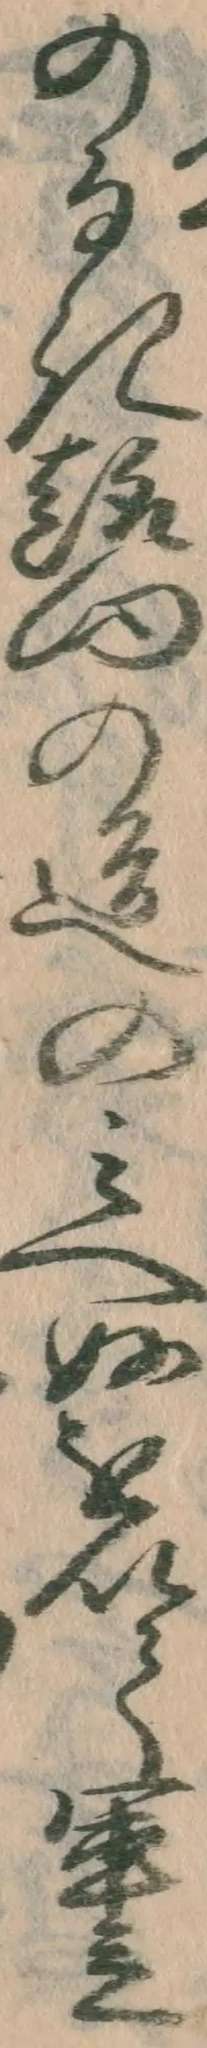のなき趣向の道のミへぬを以て軍立
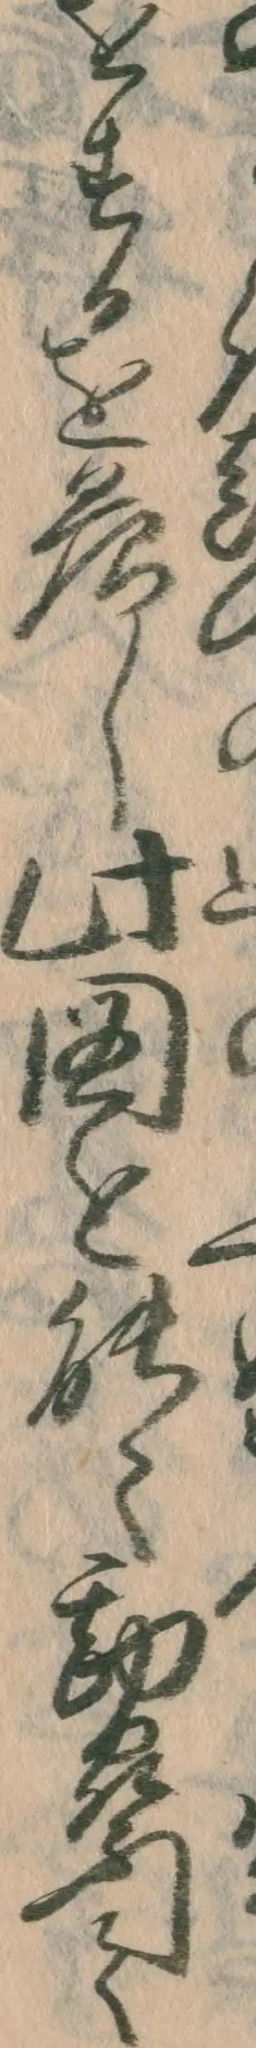をするを危し此図を能々勘察して
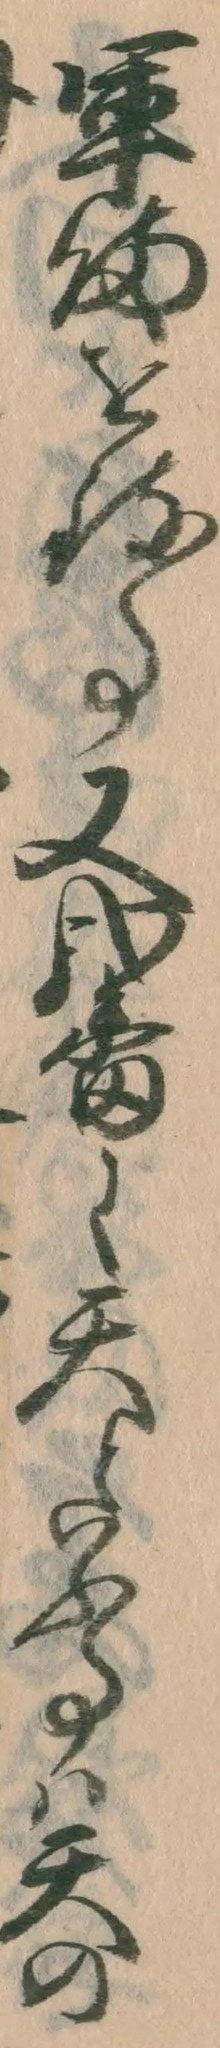軍備を致事又弐番に天といふ事ハ天の
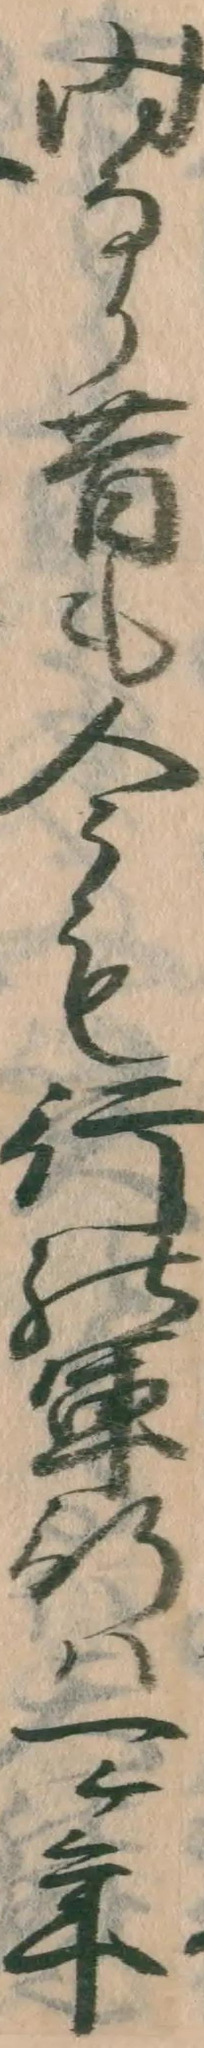時なり昔も今も行の軍行ハ一ケ年
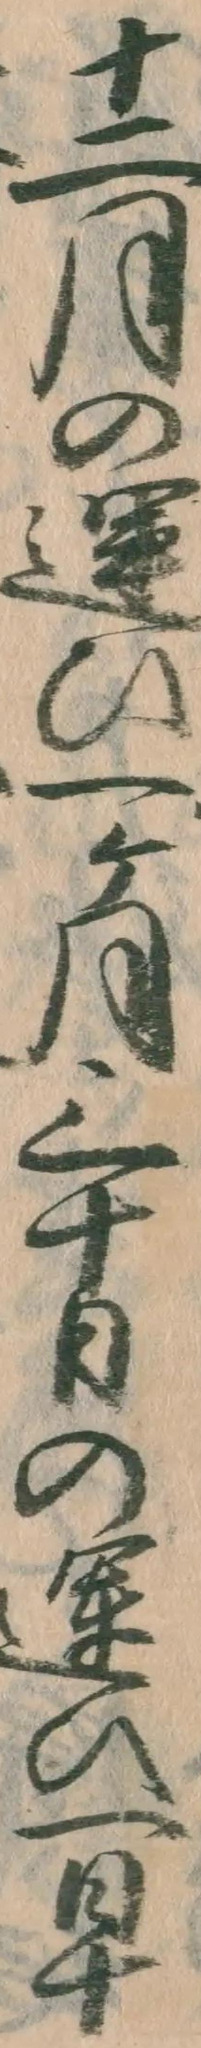十二月の運ひ一ケ月三十日の運ひ一日十
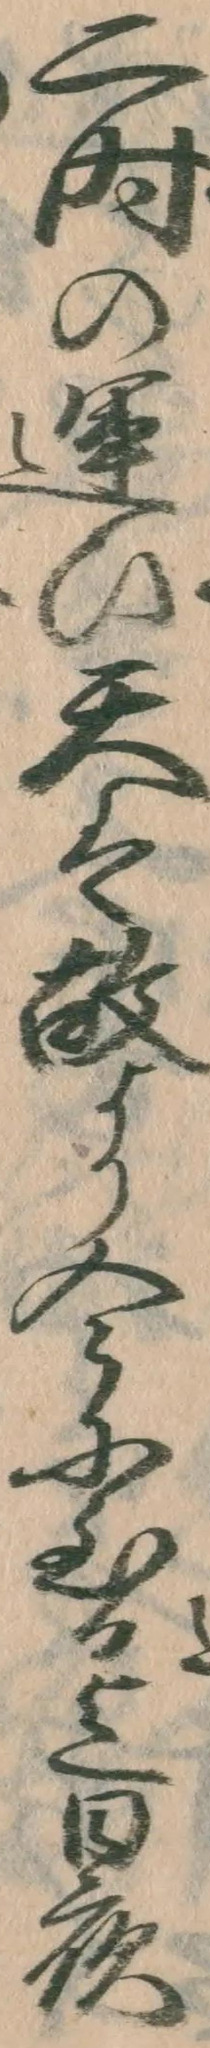二時の運ひ天は故より今に至る迄日夜
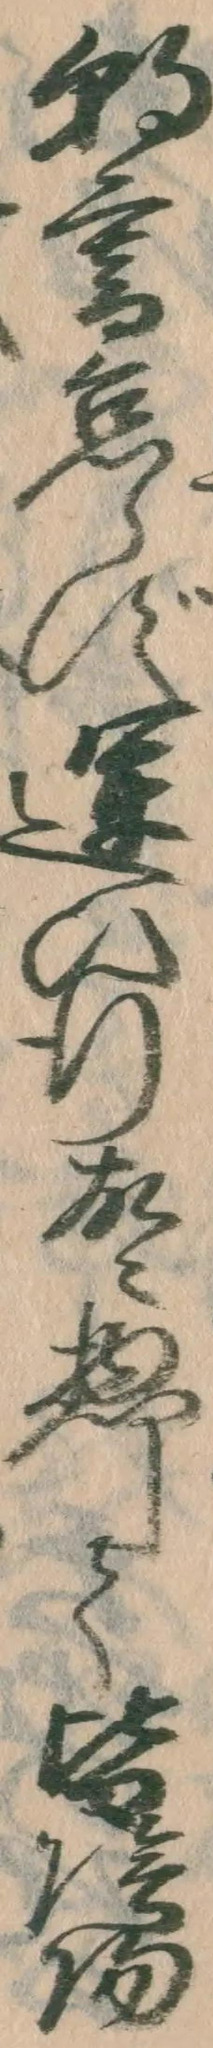朝暮怠らず運ひ行故ニ惣して皆陰陽
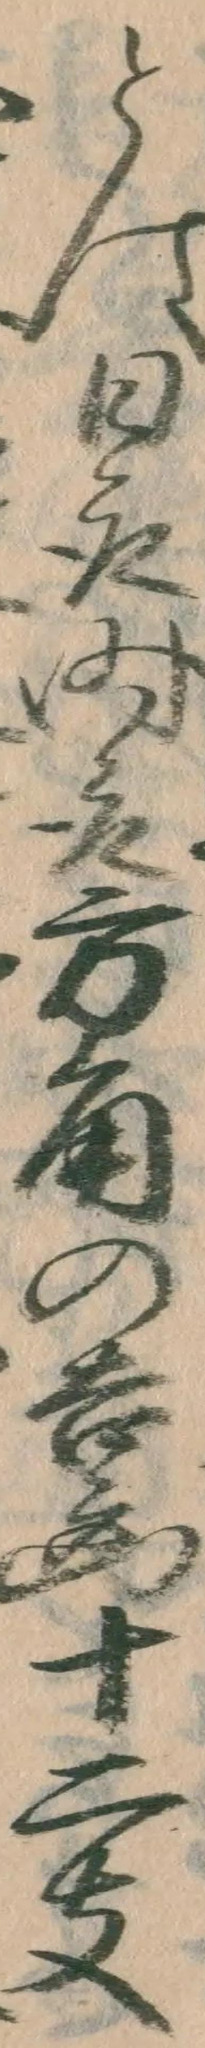とは日取時取方角の吉凶十二支
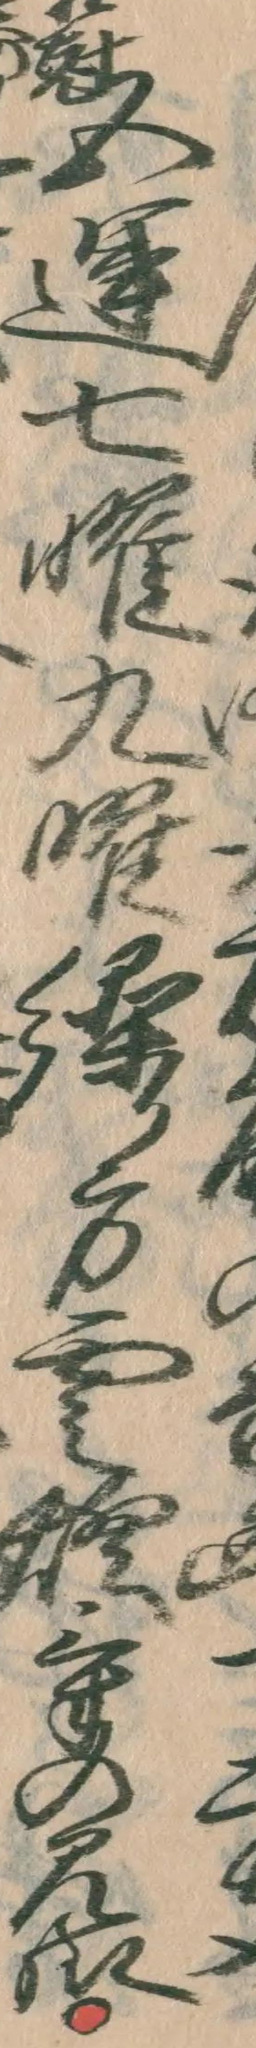五運七曜九曜繰り方雲煙氣の見様○
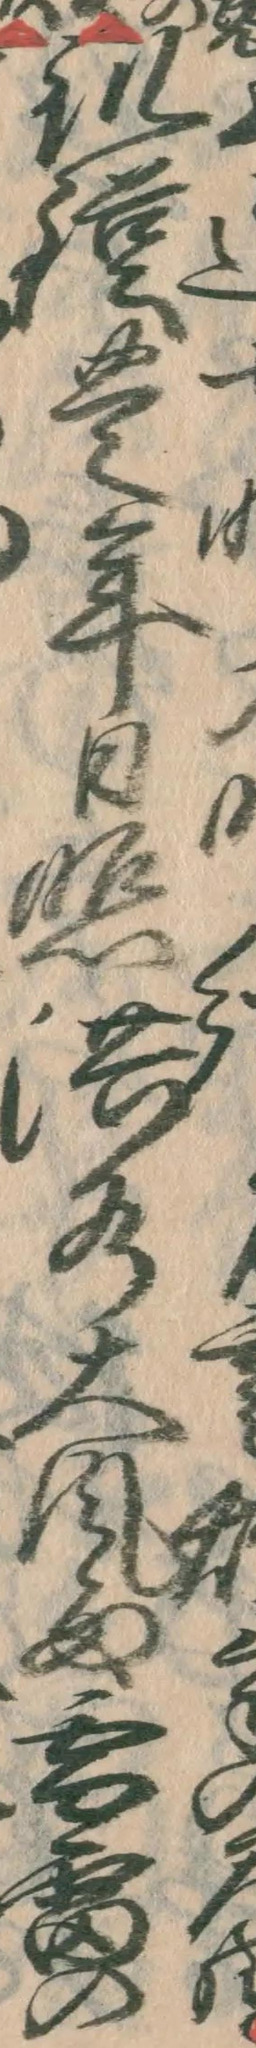飢饉豊年日照洪水大風雨雪雷の
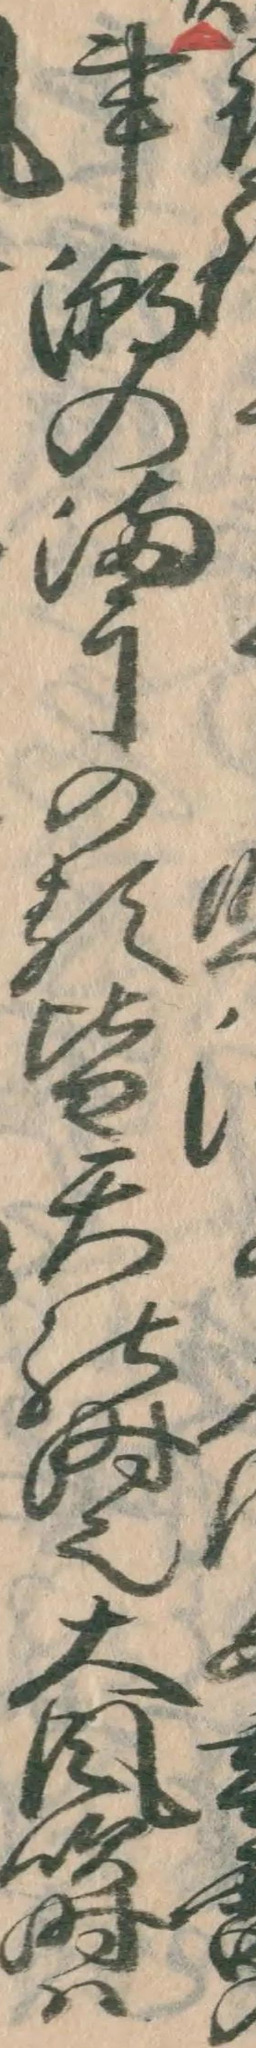事潮の満干の類皆天の時也大風吹時ハ
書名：麗斎叢書. 20
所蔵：国立国会図書館 National Diet Library, JAPAN
